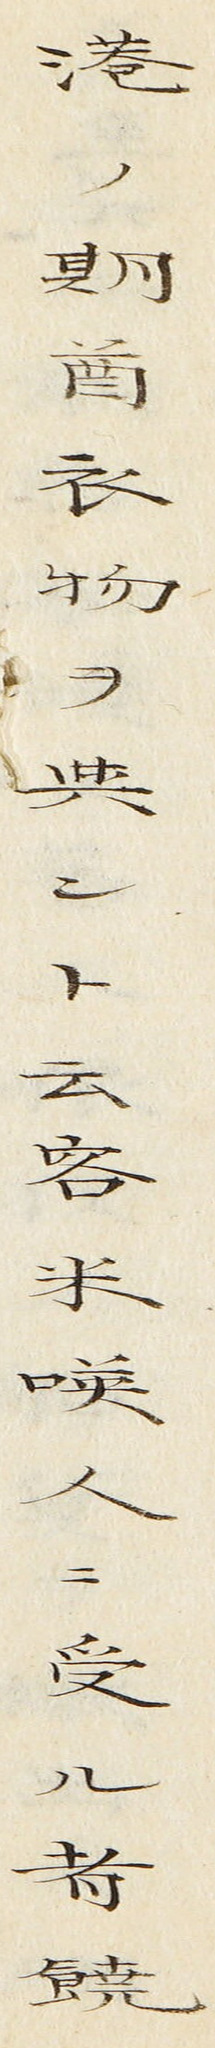港ノ期酋衣物ヲ与ント云客米人ニ受ル者饒
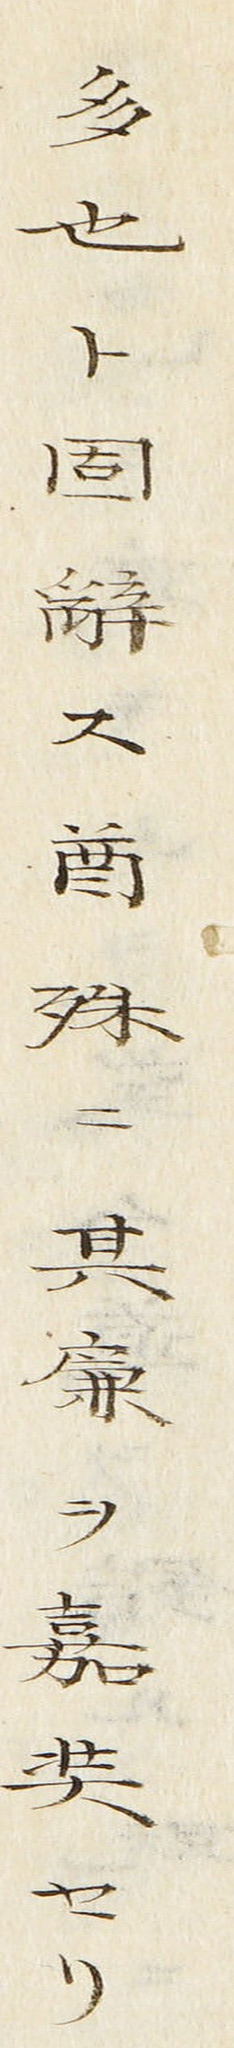多也ト固辞ス酋殊ニ其廉ヲ嘉奘セリ
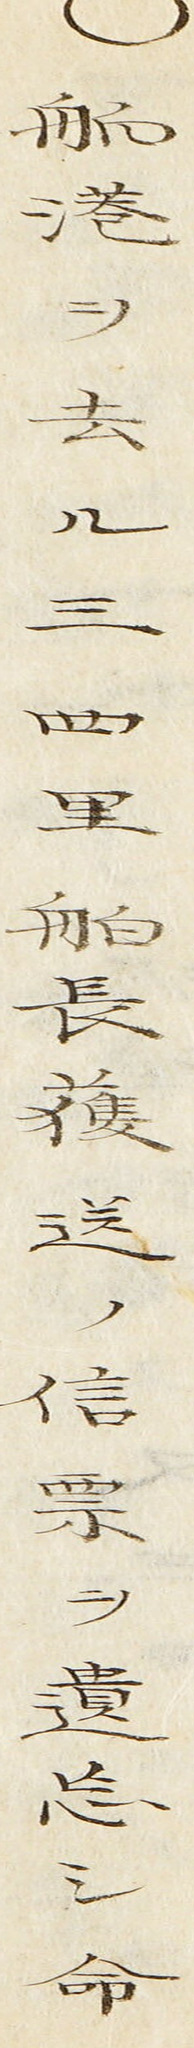〇舶港ヲ去ル三四里舶長獲送ノ信票ヲ遺シ命
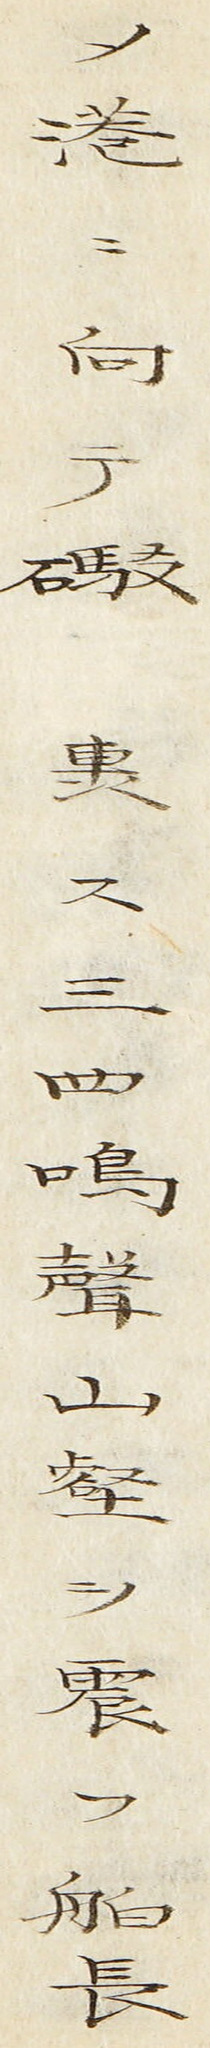シテ港ニ向テ礟軣ス三四鳴声山壑ヲ震フ舶長
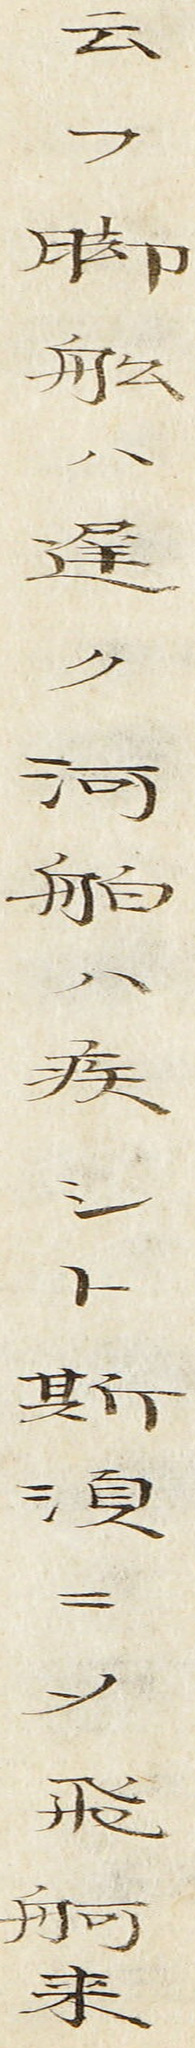云フ脚舩ハ遅ク河舶ハ疾シト斯須ニシテ飛舸来
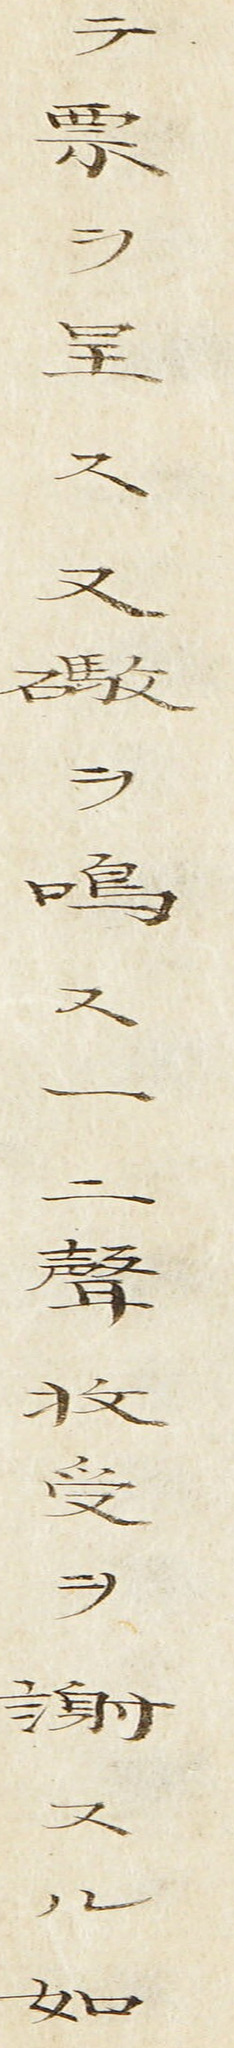テ票ヲ呈ス又礟ヲ鳴ス一二声受ヲ謝スル如
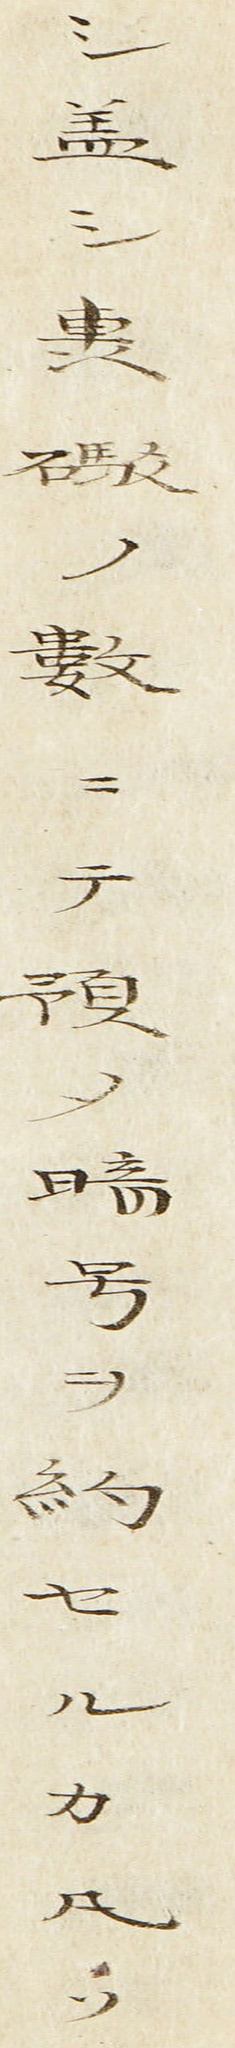シ蓋シ軣礟ノ数ニテ預シテ暗号ヲ約セルカ凡ソ
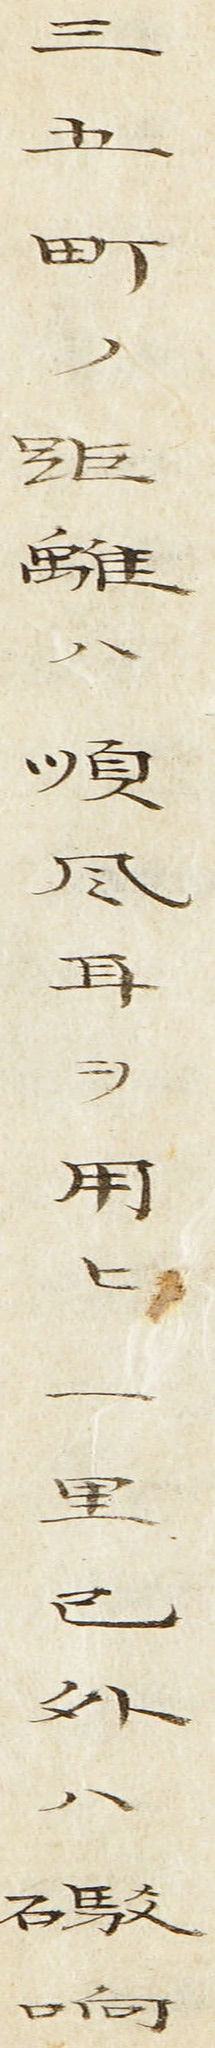三五町ノ距離ハ順風耳ヲ用ヒ一里已外ハ礟响
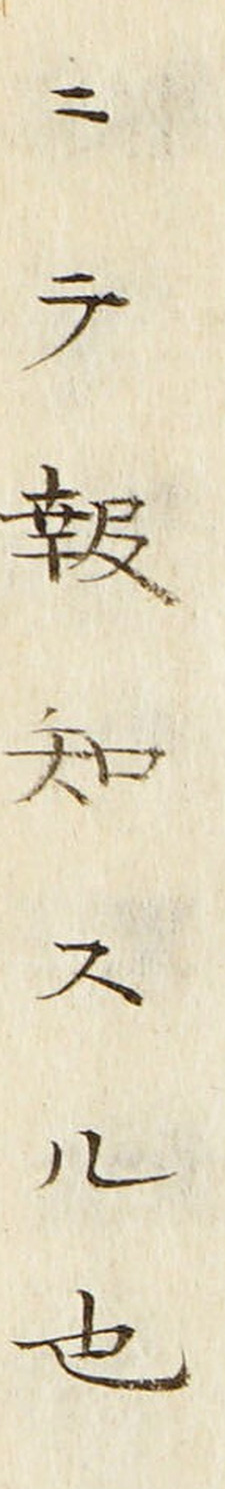ニテ報知スル也

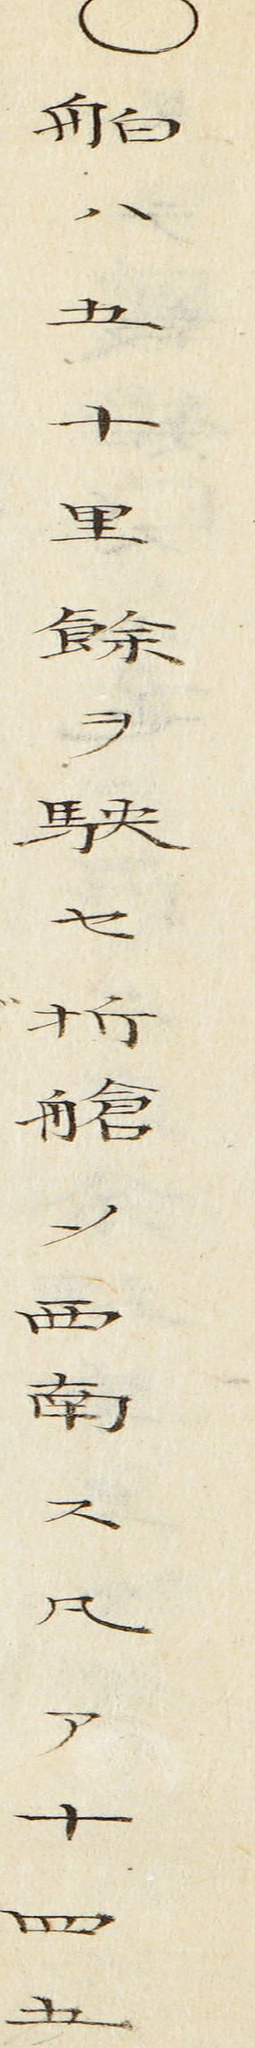〇舶ハ五十里余ヲ駚セ折艙シテ西南ス凡ア十四五
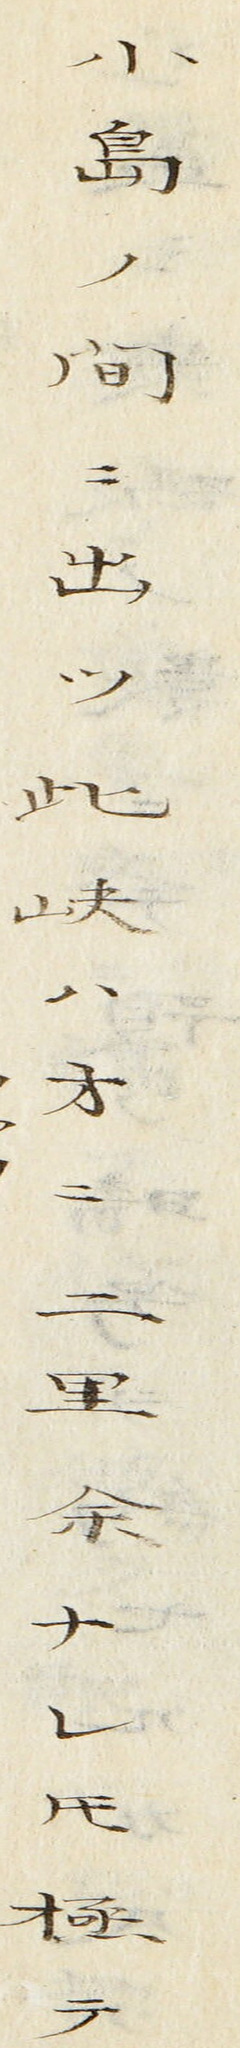小島ノ間ニ出ツ此ハニ二里余ナレドモ極テ
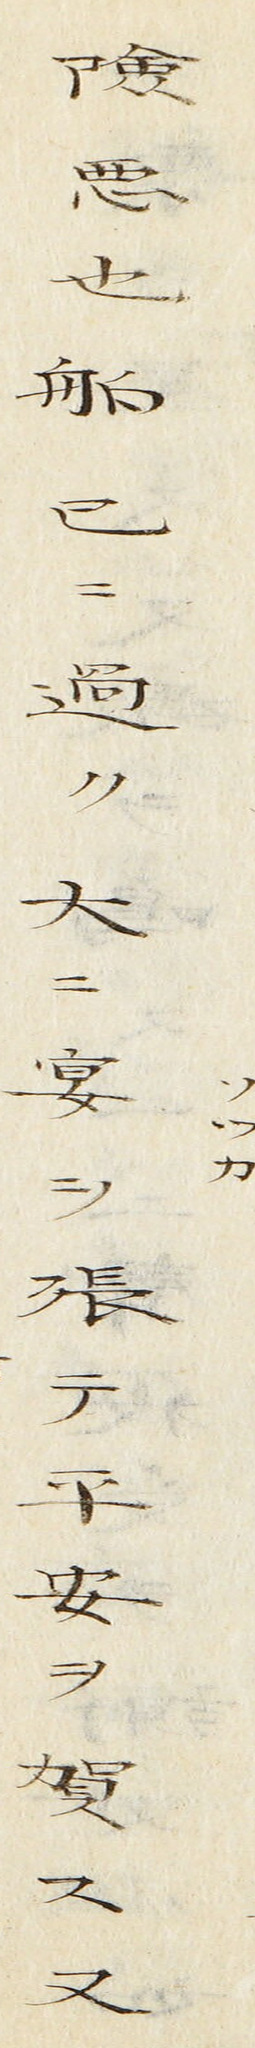険悪也舶已ニ過ク大ニ宴ヲ張テ平安ヲ賀ス又
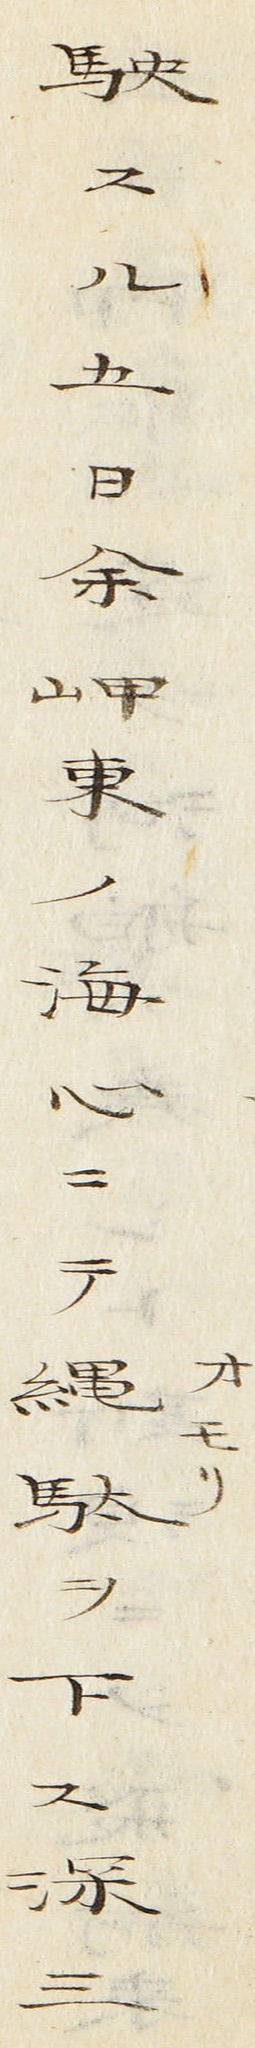駚スル五日余岬東ノ海心ニテ縄駄ヲ下ス深三
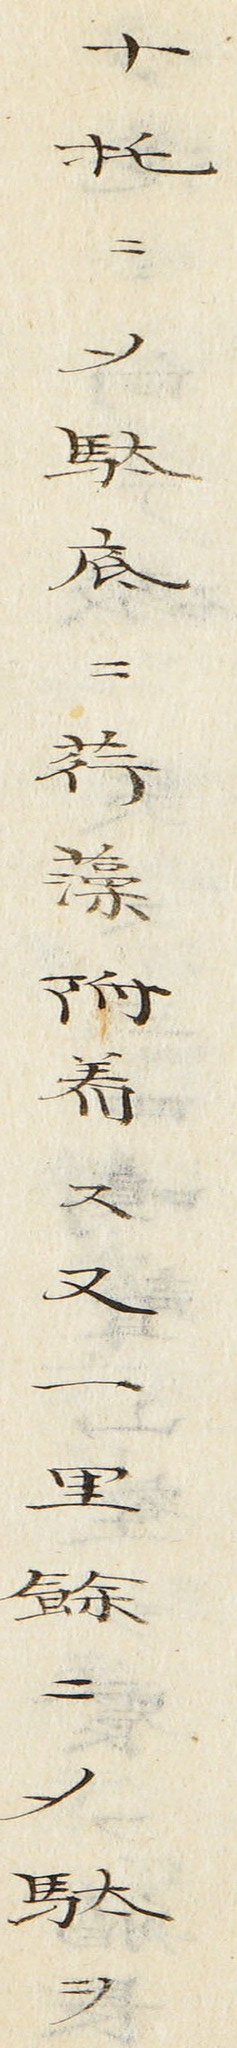十托ニシテ駄底ニ荇藻附着ス又一里余ニシテ駄ヲ
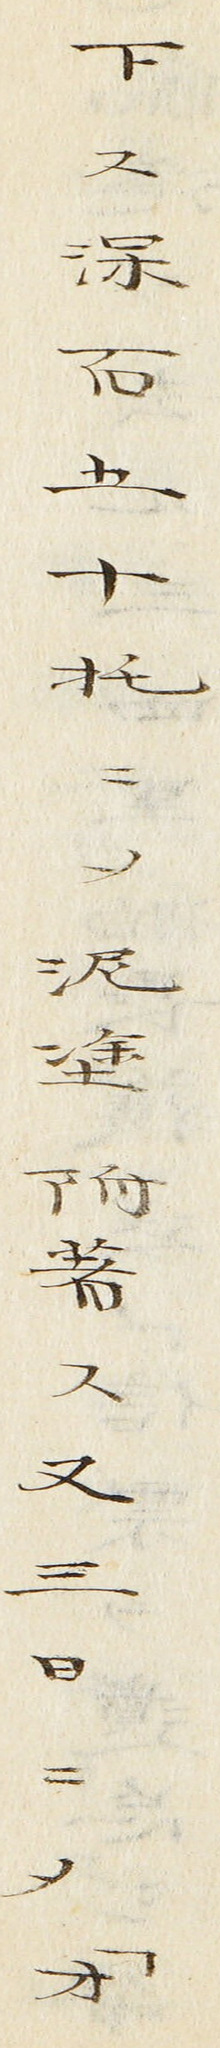下ス深百五十托ニシテ泥塗附着ス又三日ニシテ「オ
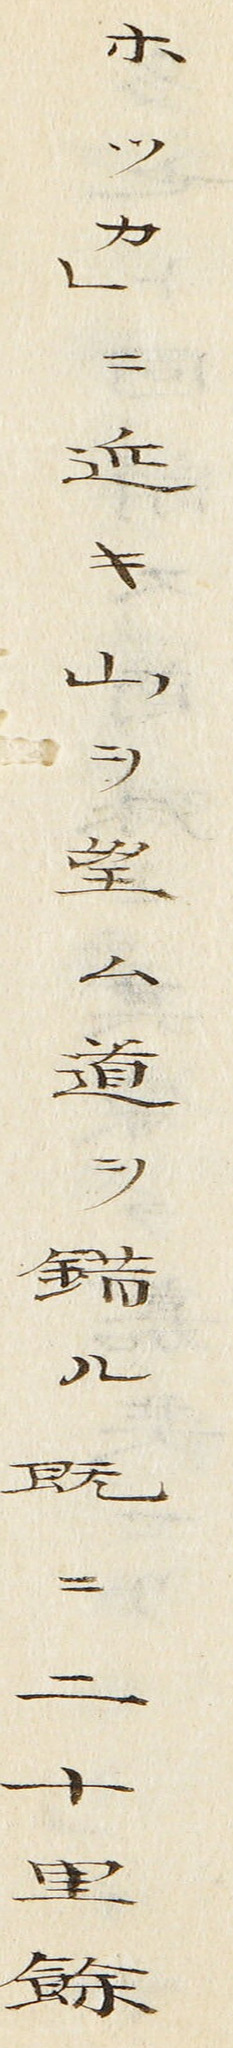ホツカ」ニ近キ山ヲ望ム道ヲ錯ル既ニ二十里余
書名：蕃談
